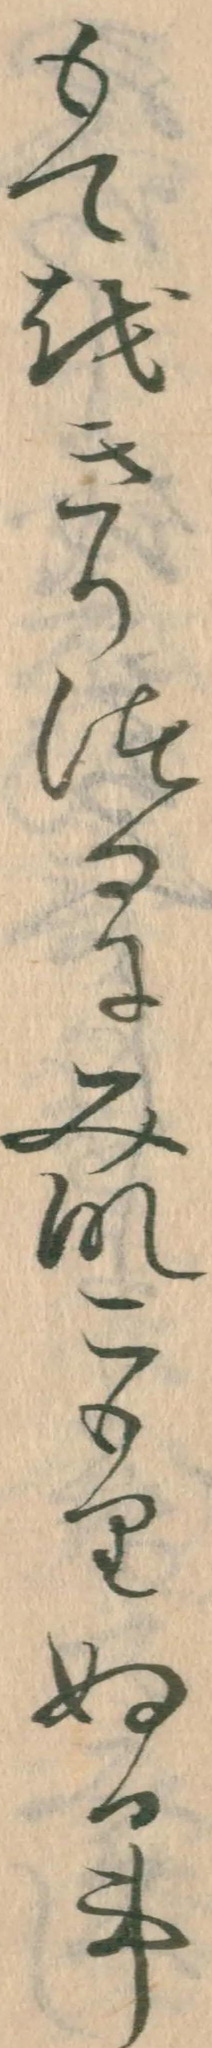もてをきりつるにみなこもりぬる事
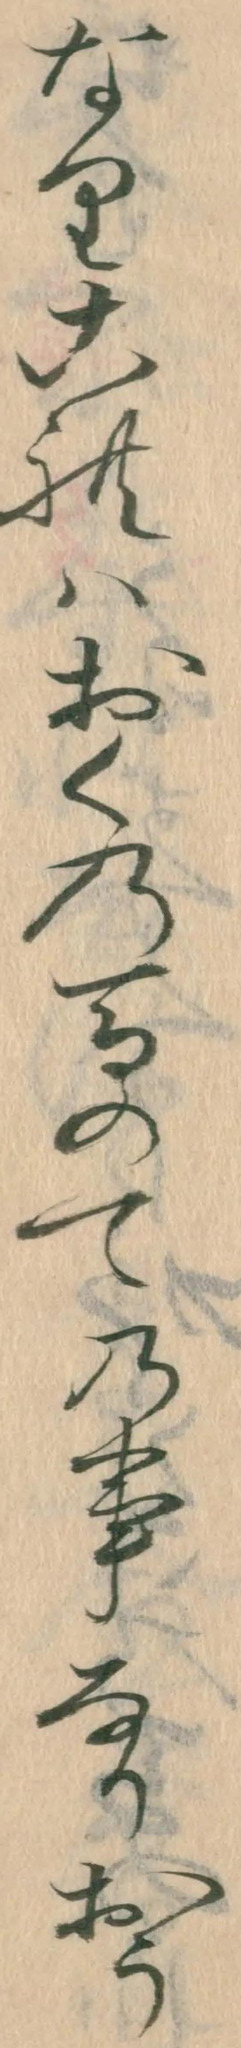なりこれはおくの馬のての事なりおう
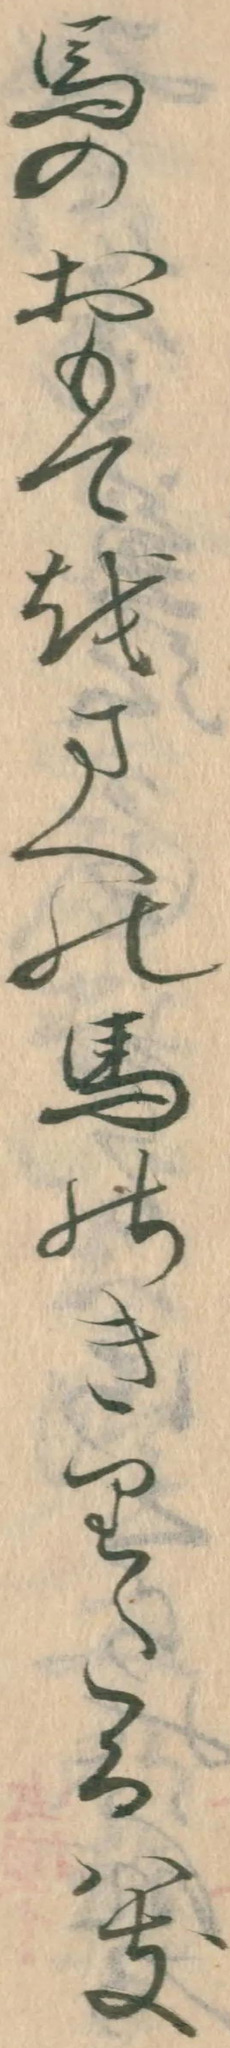馬のおもてをまへの馬のきりたるはき
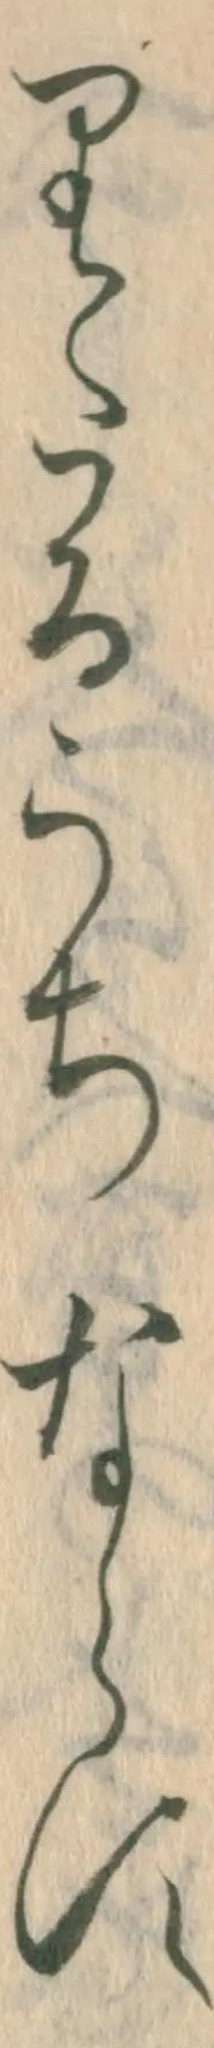りたるうちならす
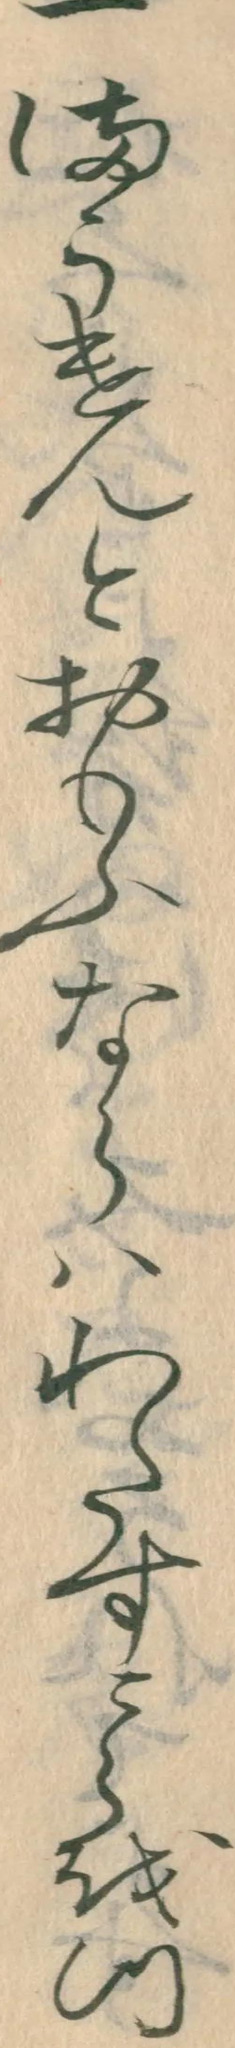一まうけんとおもふならはわたすにらをつ
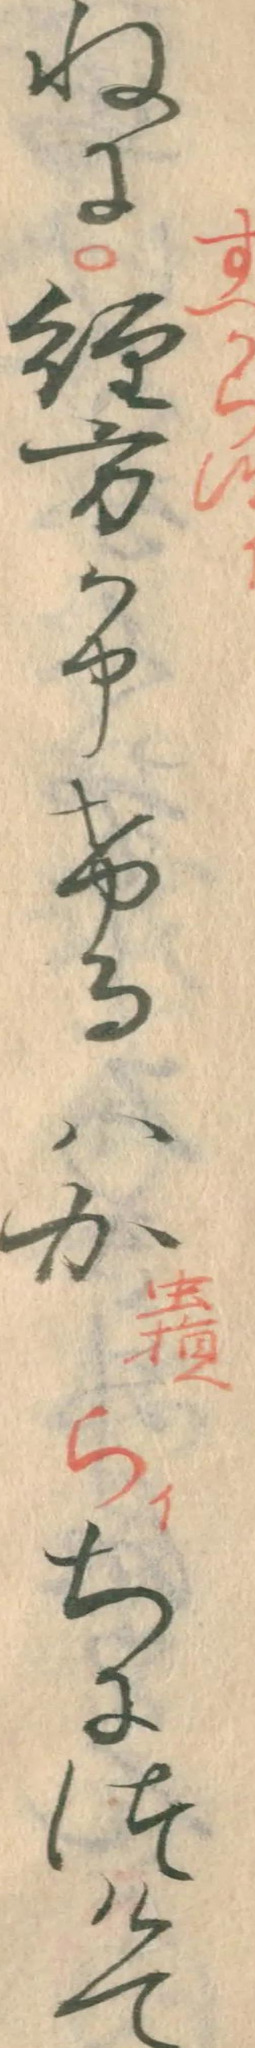ねに◦経方か申けるはからちにつけて
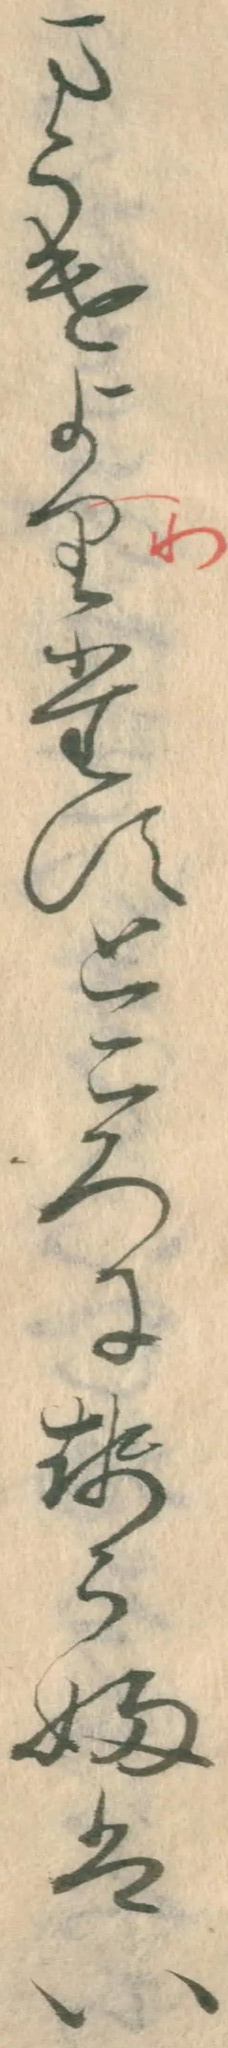まうけよりたすところにせうふはい
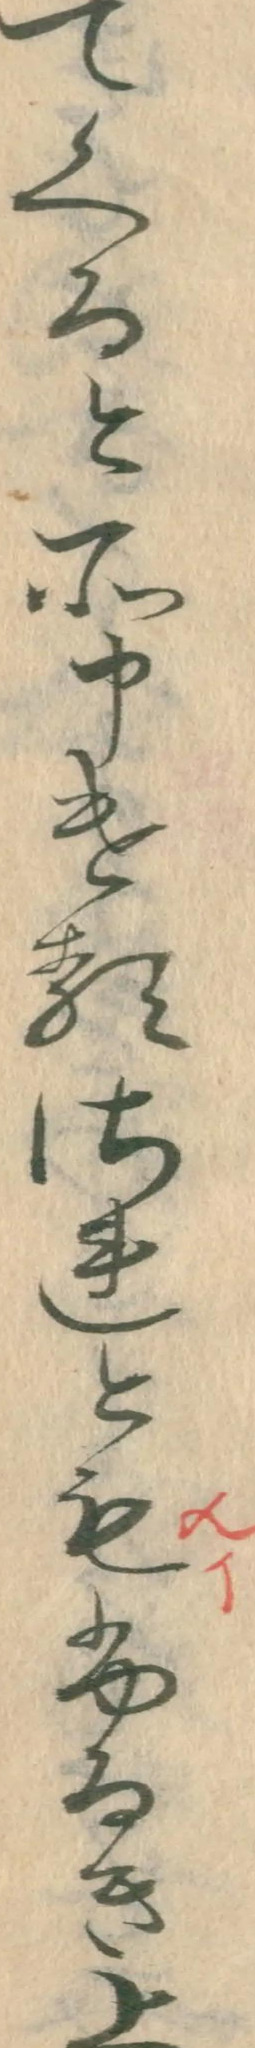てくるとそ申けるされともふるき上

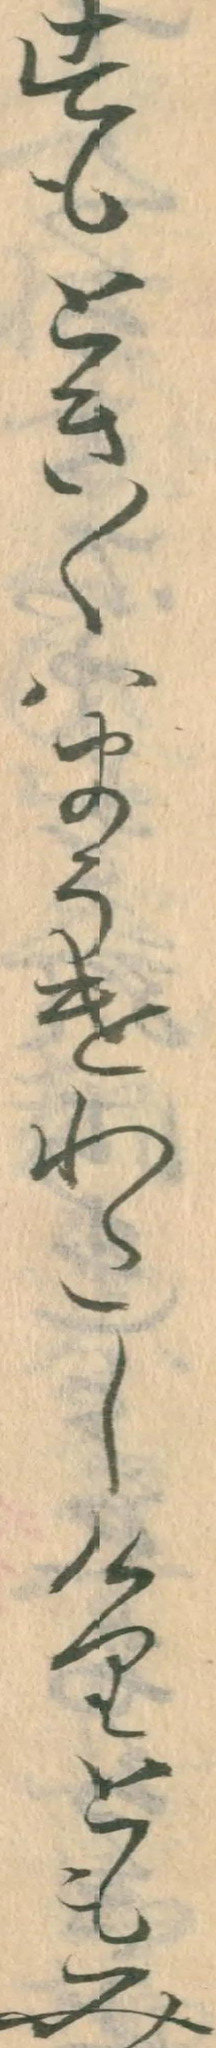すもとき〳〵はまうけわたしけりともみ
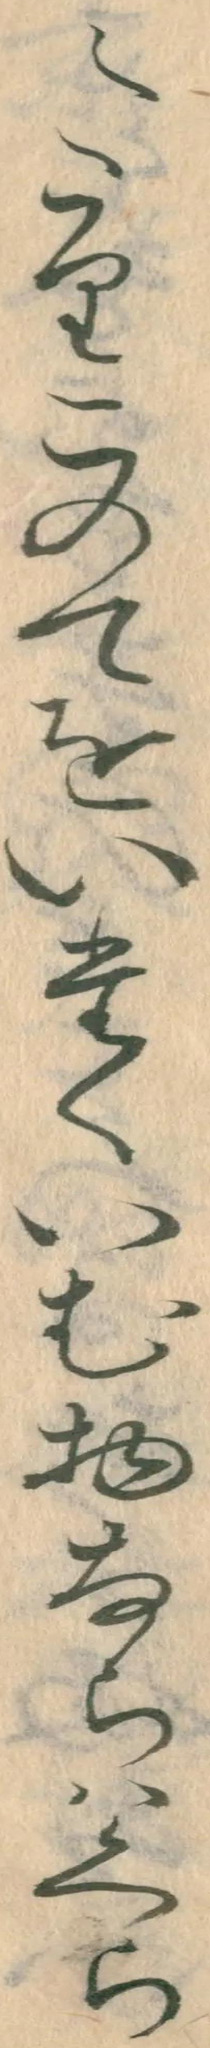えたりこのてをいたくいむ物ならはくら
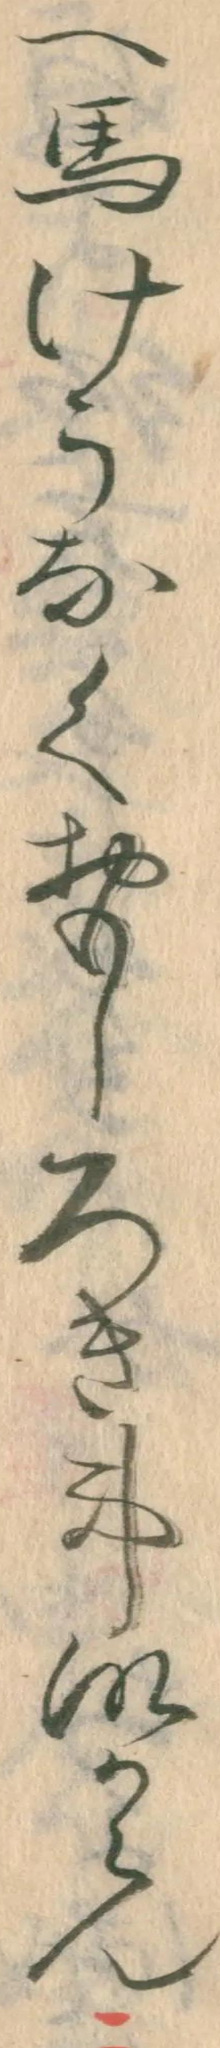へ馬けうなくおもしろき事なからんか
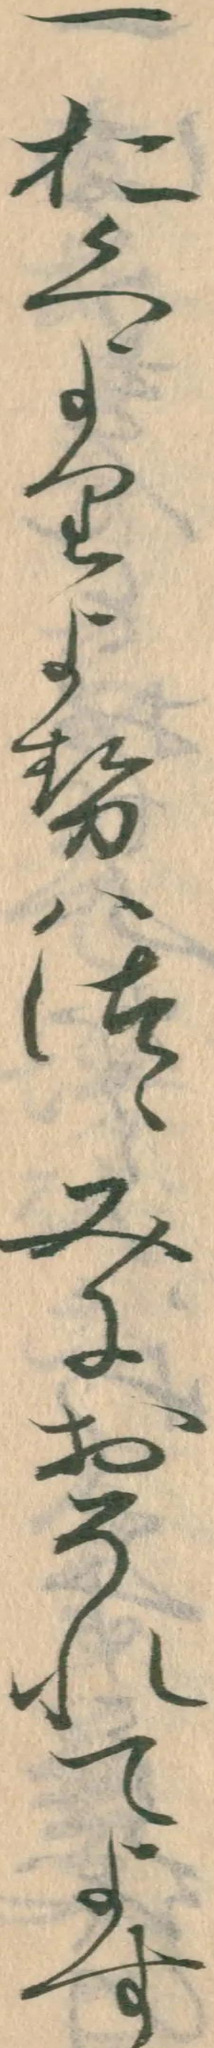一おくよりよせはつゝみにおそれてよす
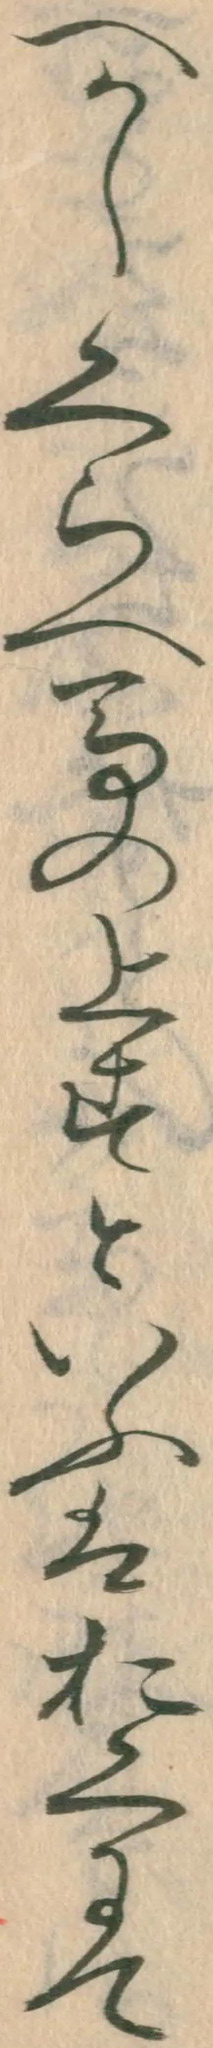へかしくらへ馬の上すといふはおくにて
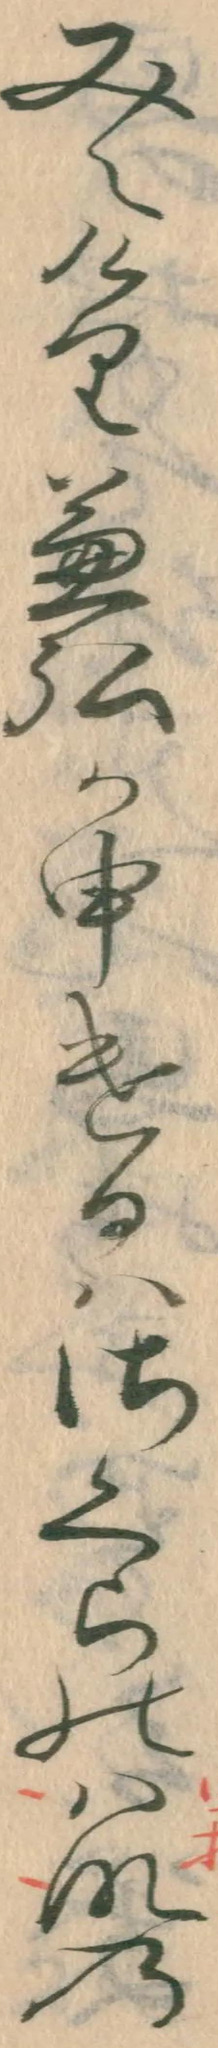みえけり兼弘か申けるはさくらの「はな」の
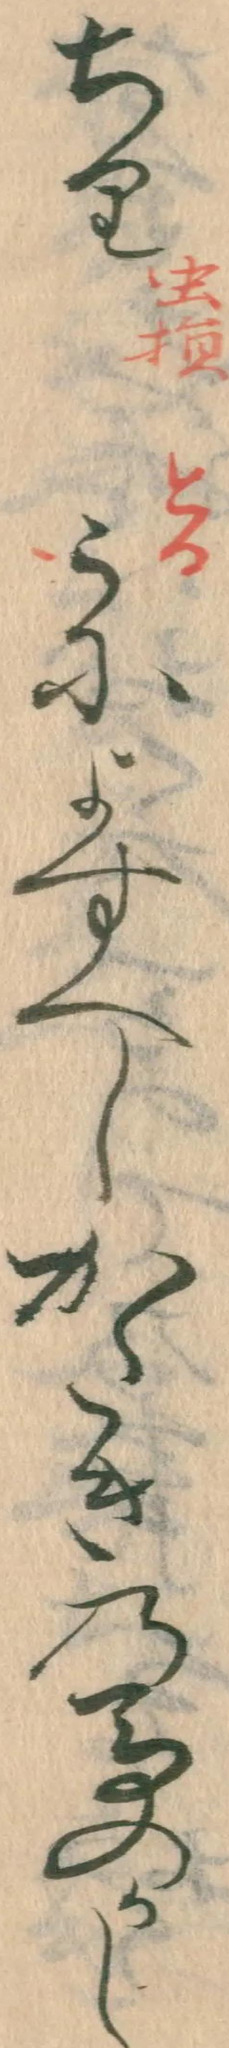ちり「う」によすへしかたきの馬のかし
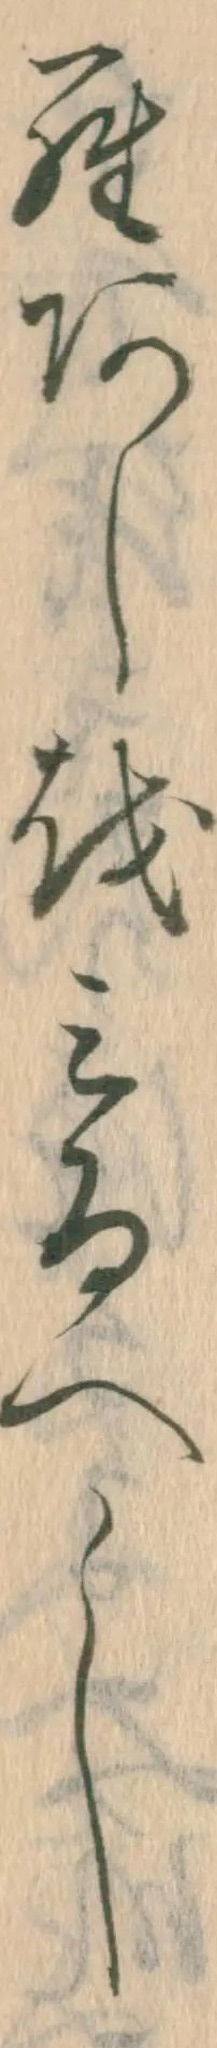らあしをみるへし
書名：賀茂社記録. 第13冊
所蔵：国立国会図書館 National Diet Library, JAPAN
